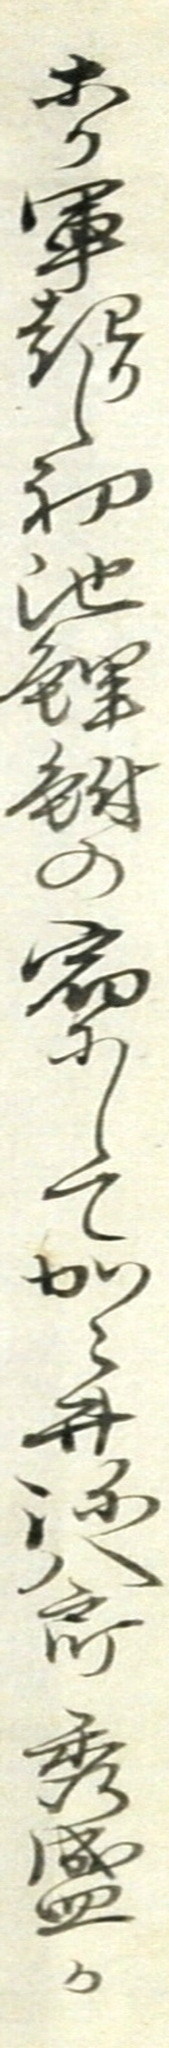等か軍起りし初池鯉鮒の宿にして加々井弥八郎秀盛か
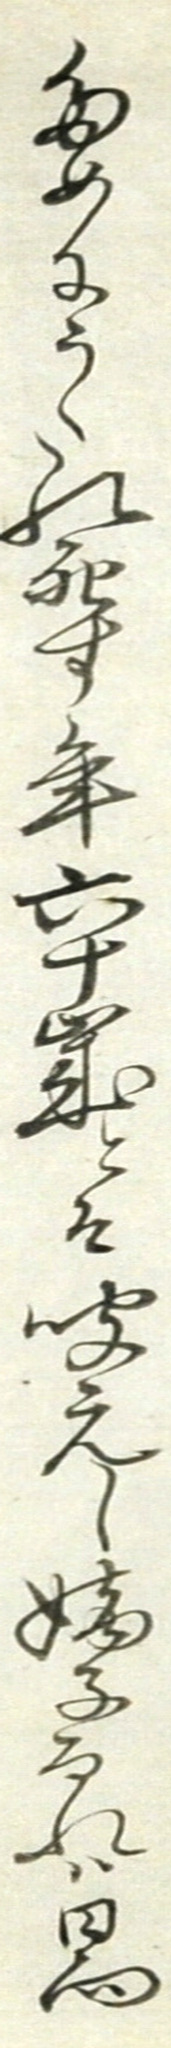ためにうたれ死す年六十歳とそ聞えし嫡子なれは日向
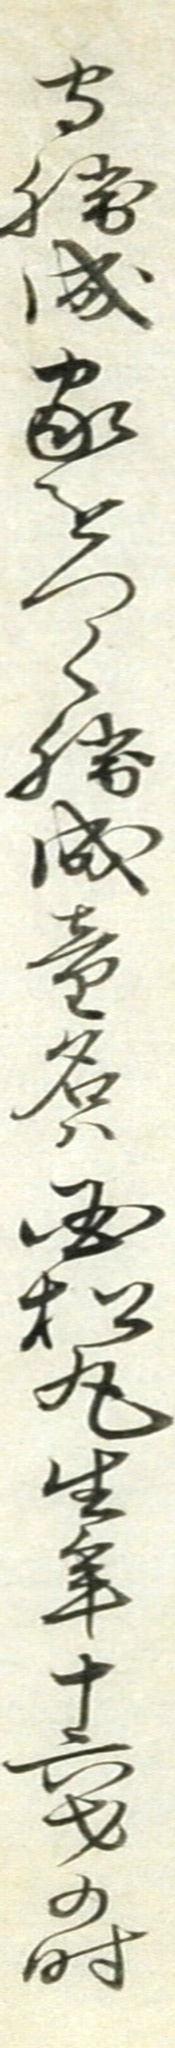守勝成家をつく勝成童名は国松丸生年十六才の時
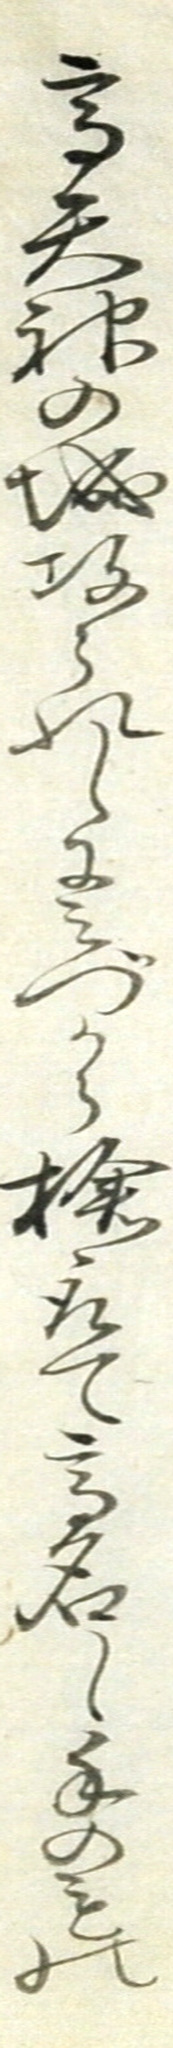高天神の城攻られしにみづから槍取て高名し手のもの
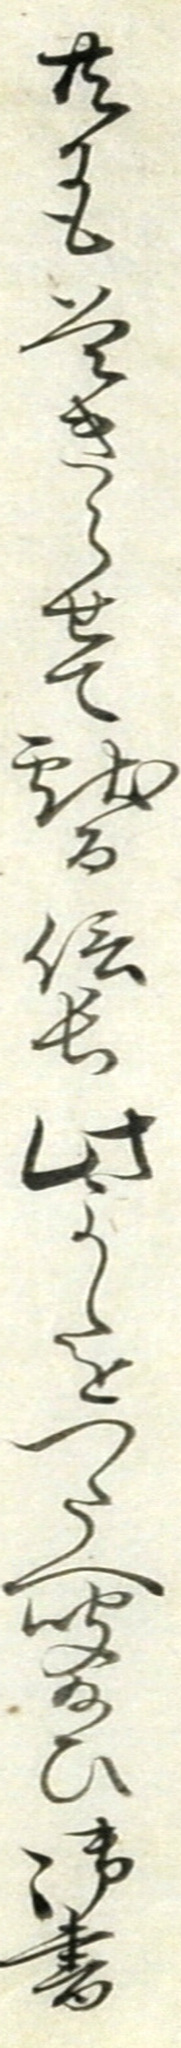共にも首きらせて献る信長此よしをつたへ聞給ひ御書
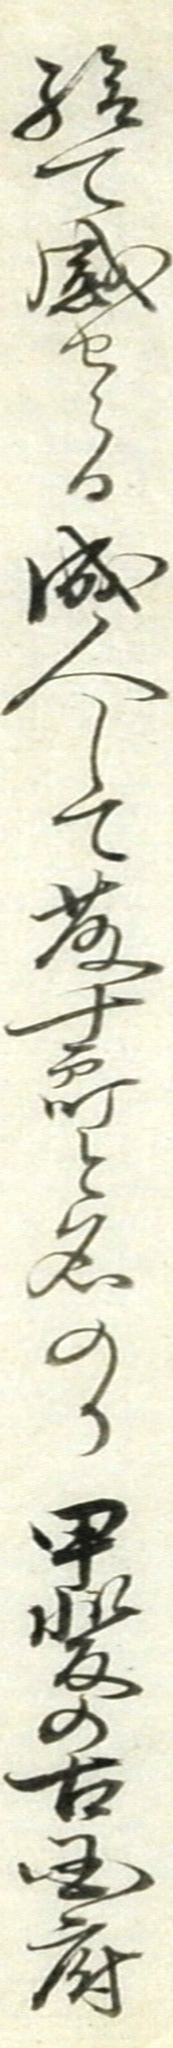給て感せらる成人して藤十郎と名のり甲斐の古国府
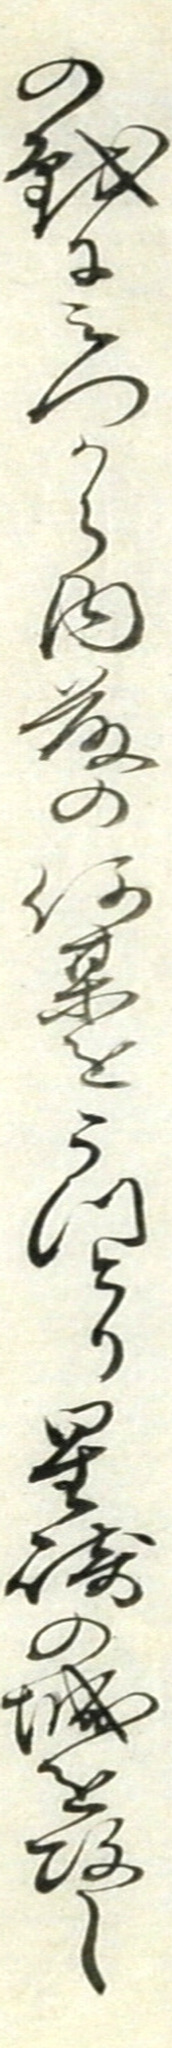の戦にみつから内藤の何某をうつとり星崎の城を攻し
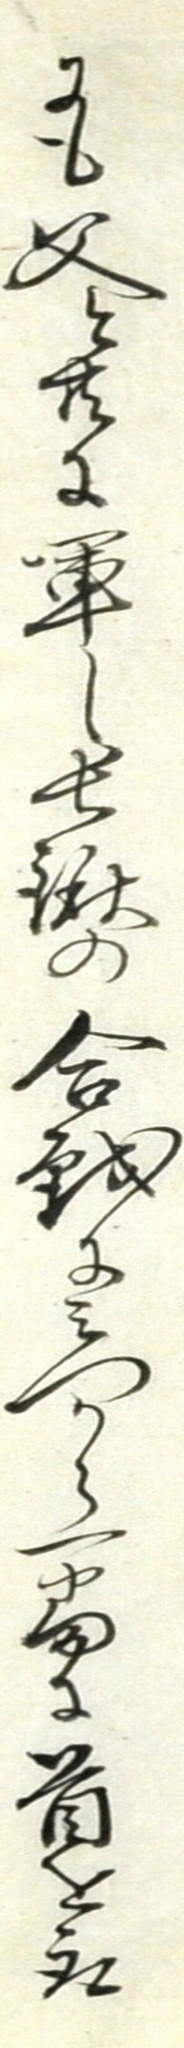にも父と共に軍し長鍬の合戦にみつから一番に首を取
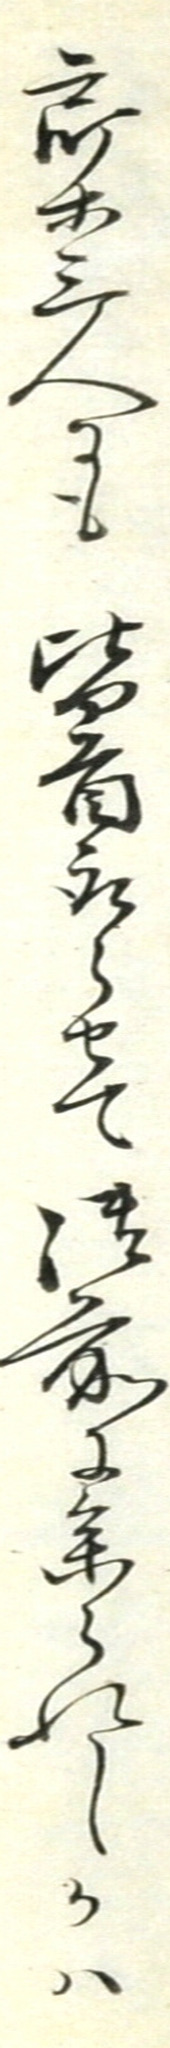郎等三人にも皆首取らせて御前に参られしかは
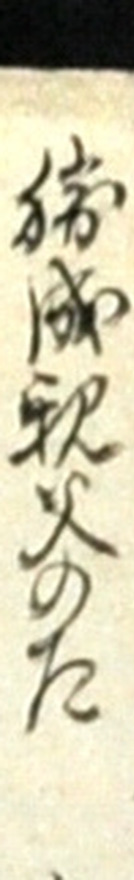勝成親父のた
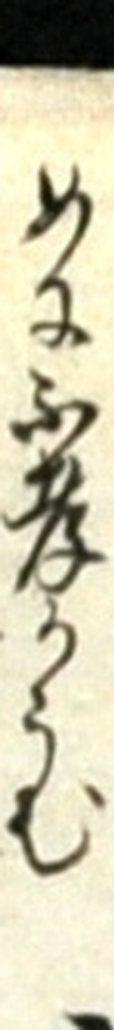めに不孝かうむ
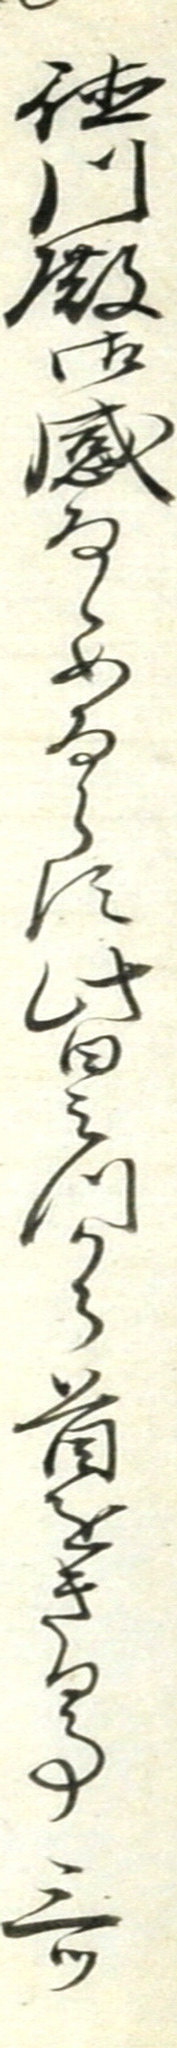徳川殿御感なゝめならす此日みつから首をきる事三ッ
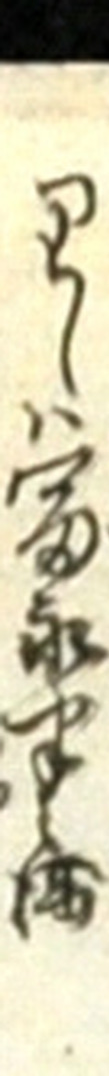りしは富永半兵衛
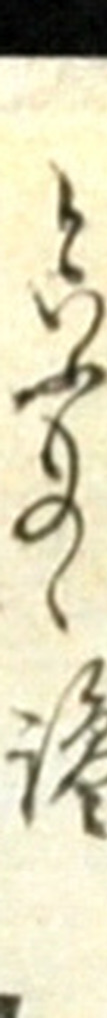といふものゝ讒
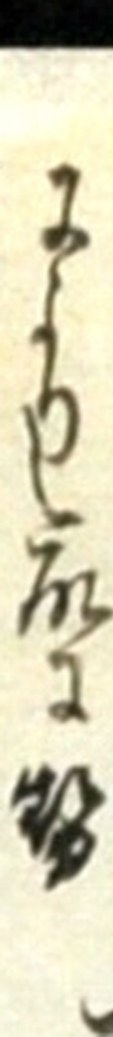によりし故に勢
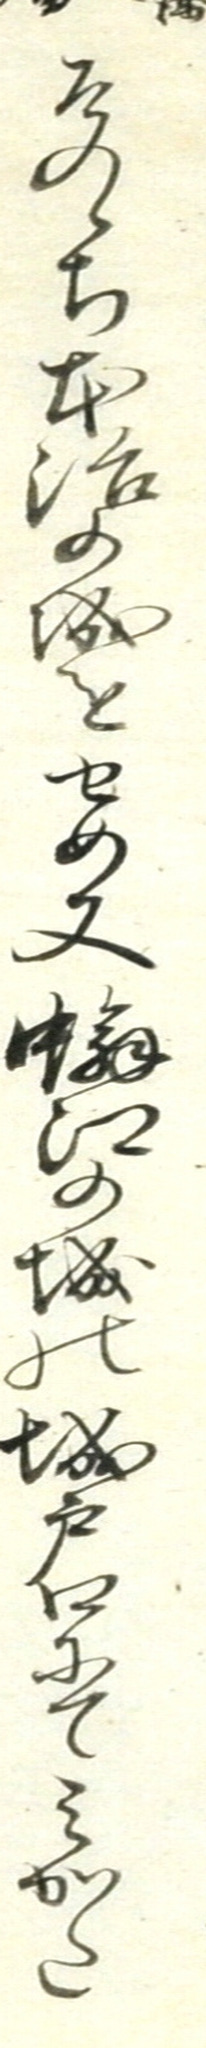そのゝち本治の城をせめ又蟹江の城の城戸口にてみかた
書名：藩翰譜（二・三）
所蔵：伊那市立高遠町図書館・合同会社AMANE
